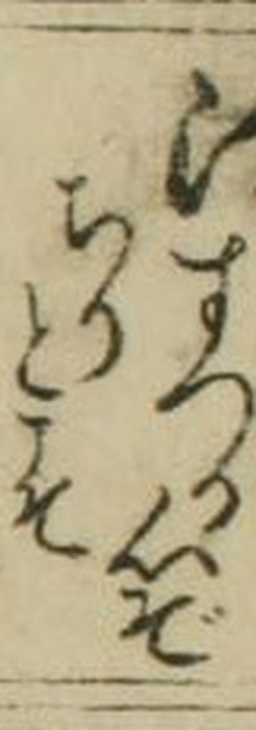ちりとこそ
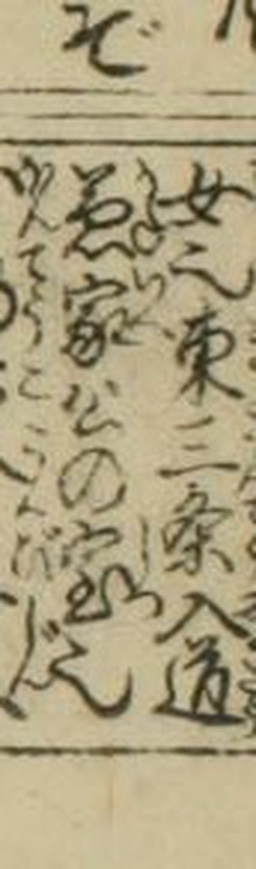兼家公の室也
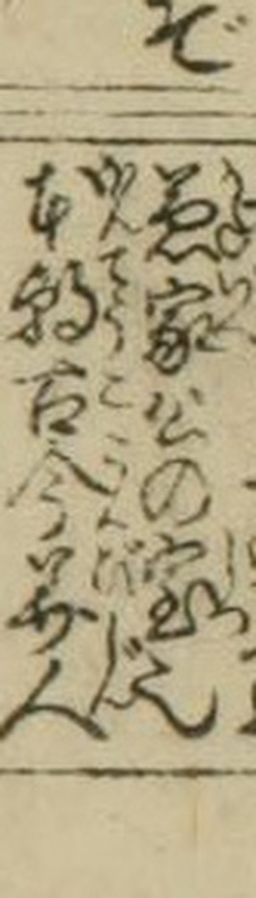本朝古今美人
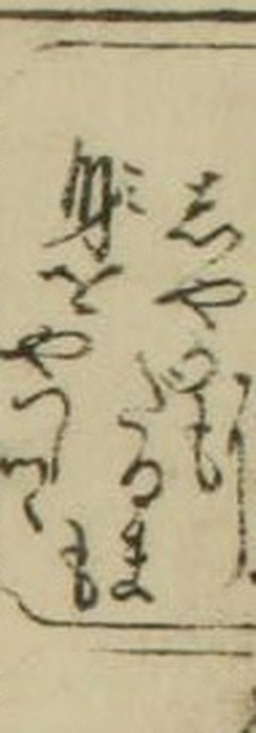身をやつしつゝ
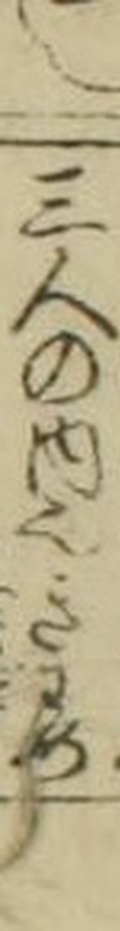三人の内也きわめ
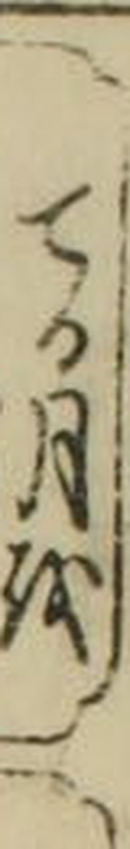てる月を
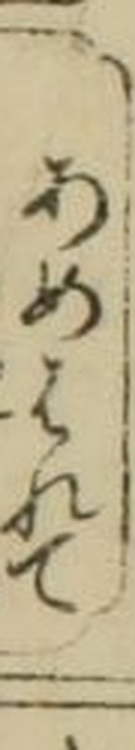あめはれて
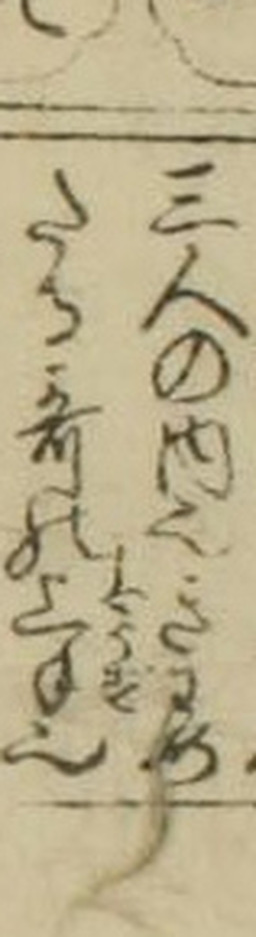たる哥の上手也
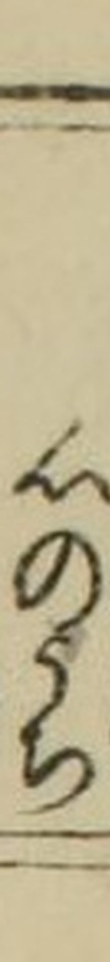心のうち
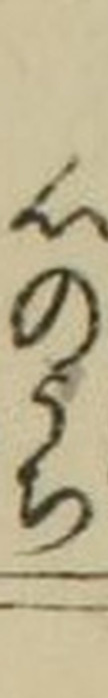心のうち
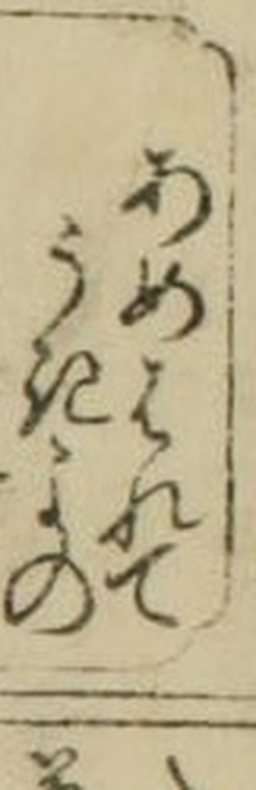うきよの
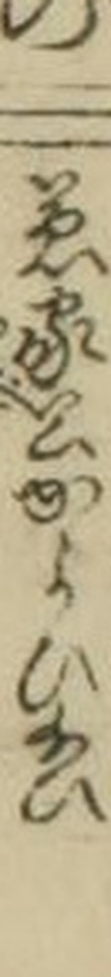兼家公かよひ給ひ
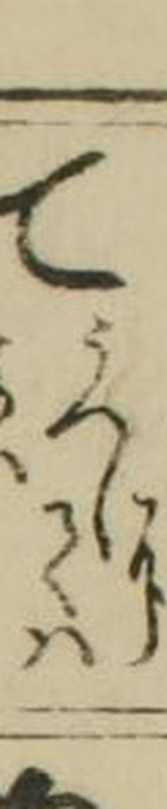うつしては
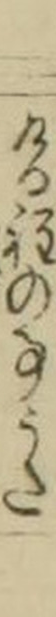ける程の事うた
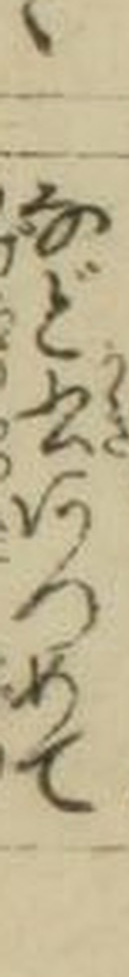など書あつめて
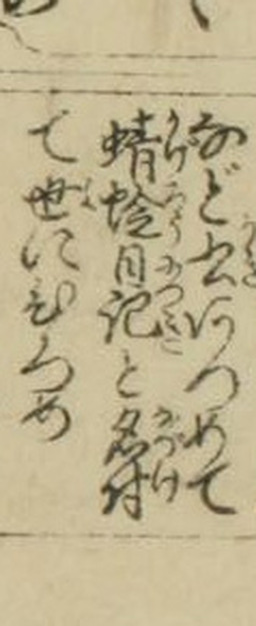蜻蛉日記と名付
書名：女源氏教訓鑑
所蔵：東京学芸大学附属図書館
